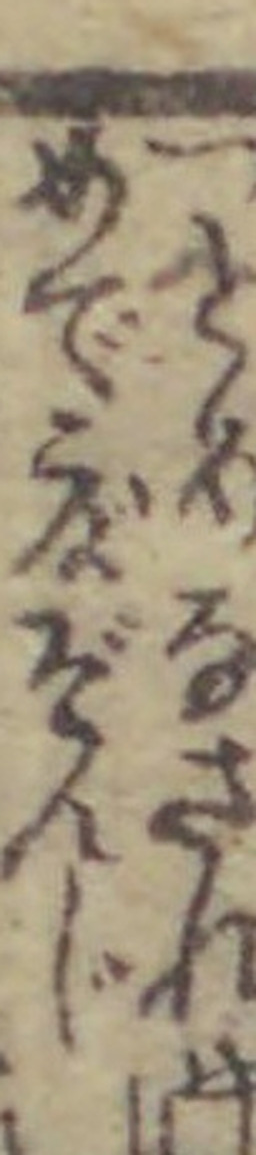めで度ぞんじ
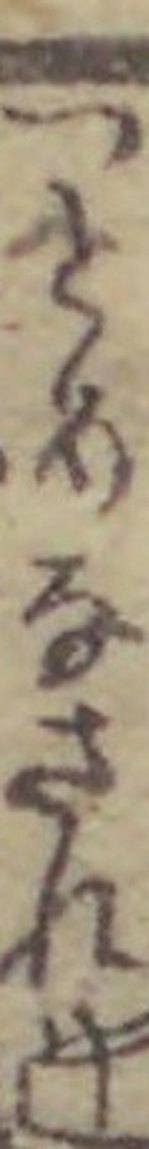つとめなされ
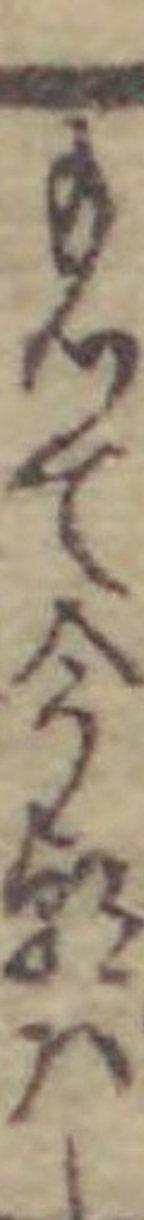もつて今朝は
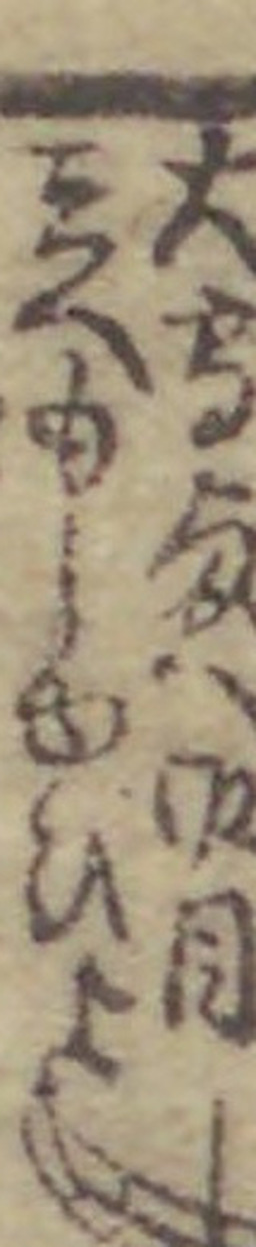みへもしゆひよ
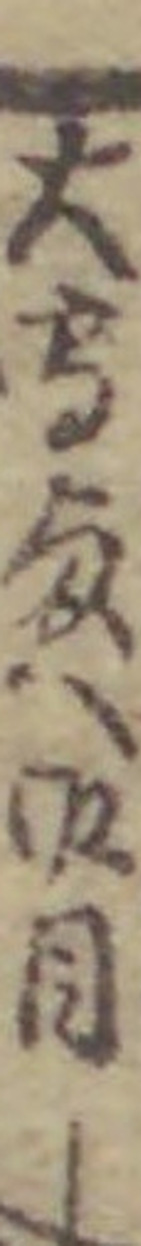大守さまへ御目
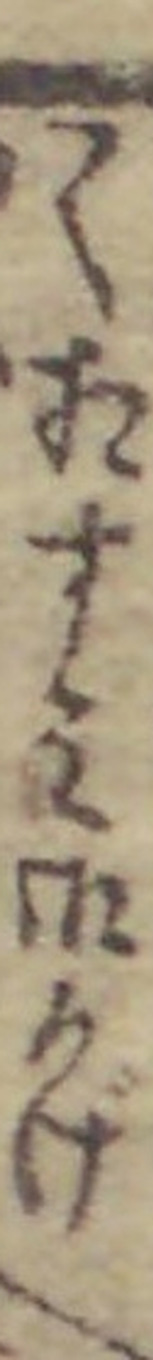く相すみ御かげ
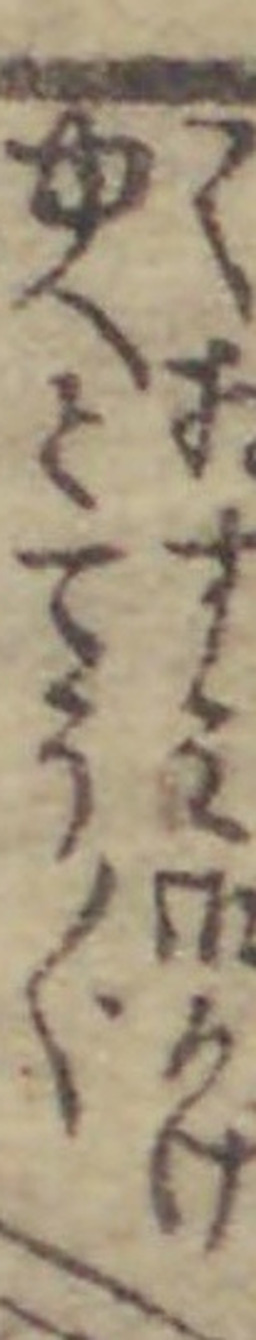ゆへとてう〳〵
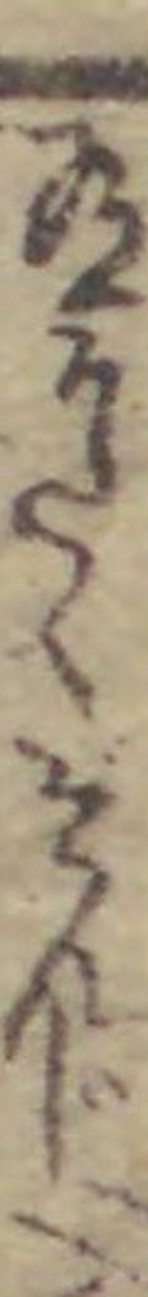有かたくぞんじ
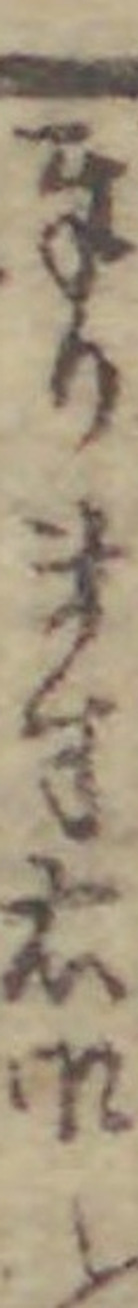奉ります右御
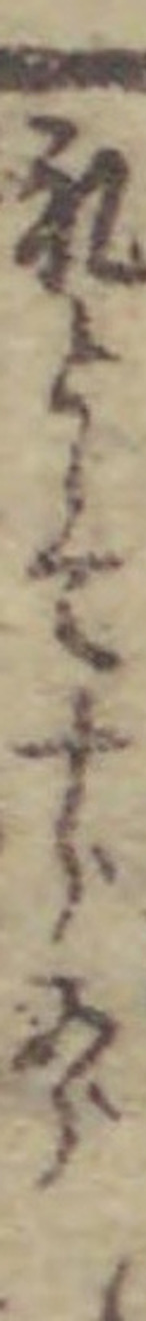礼として十郎五郎
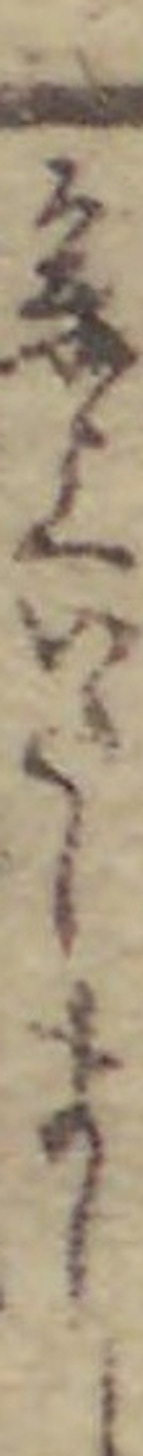参上いたしまし
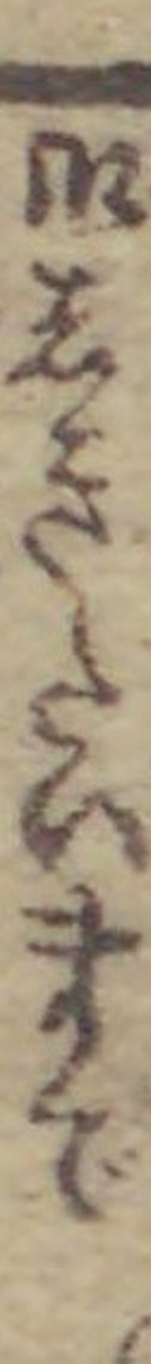御しきたいまで
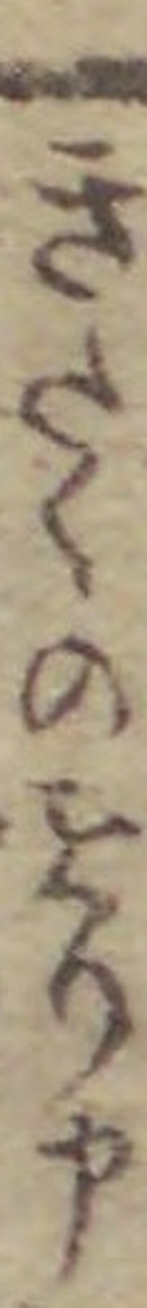きたくのをり申
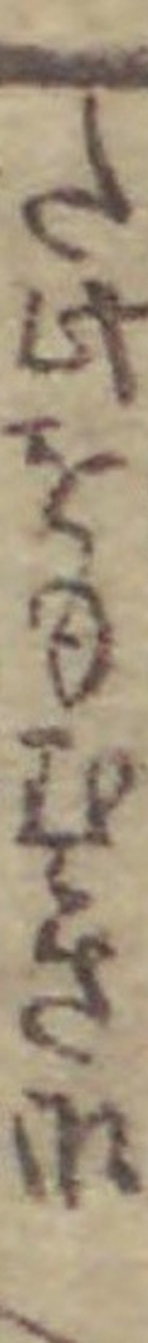た此をもむき御
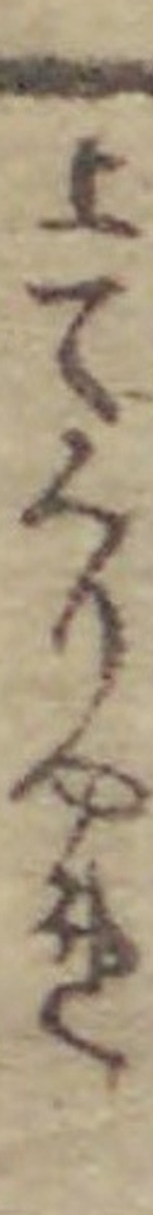上てくりやれ
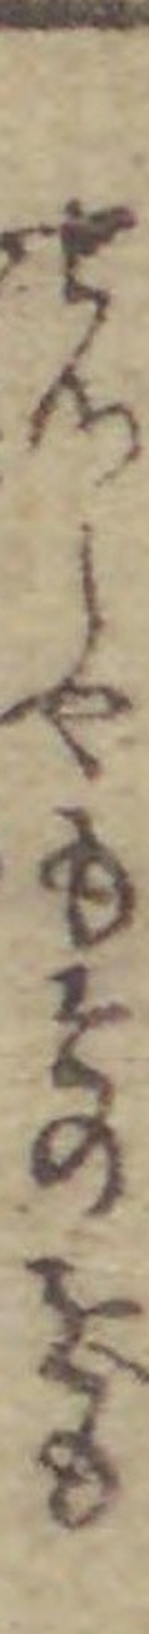せつしやもそのをも
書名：間似合嘘言曽我 3巻
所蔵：国立国会図書館 National Diet Library, JAPAN
